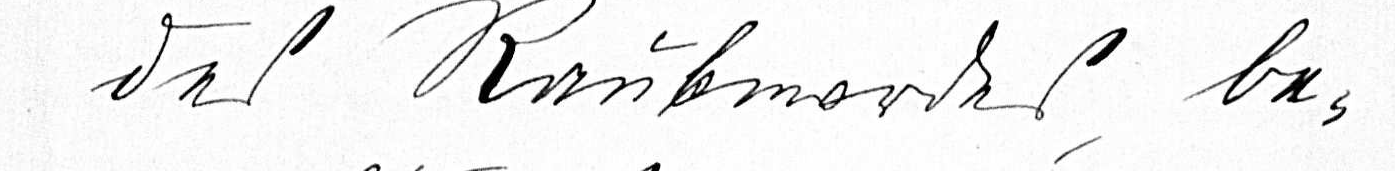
des Raubmordes, be¬
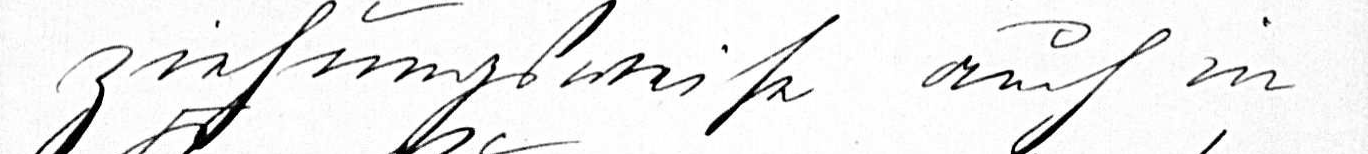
ziehungsweise auch in
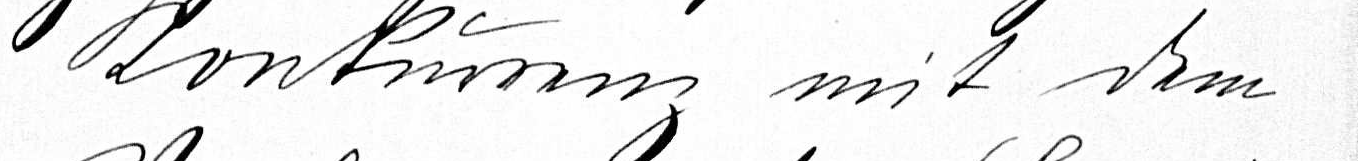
Konkurrenz mit dem
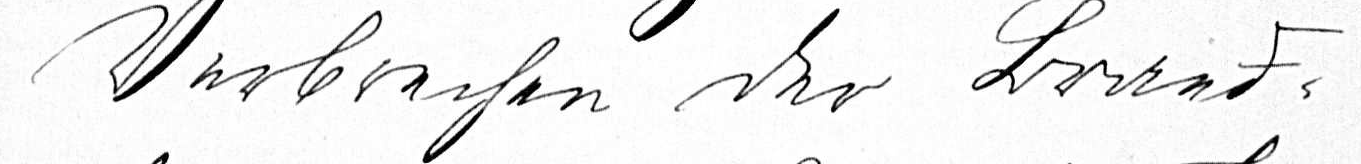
Verbrechen der Brand¬
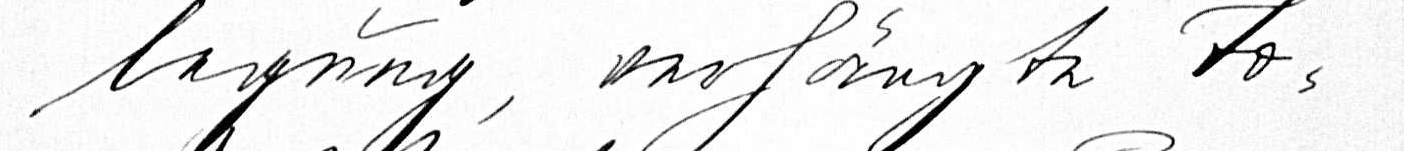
legung, verhängte To¬
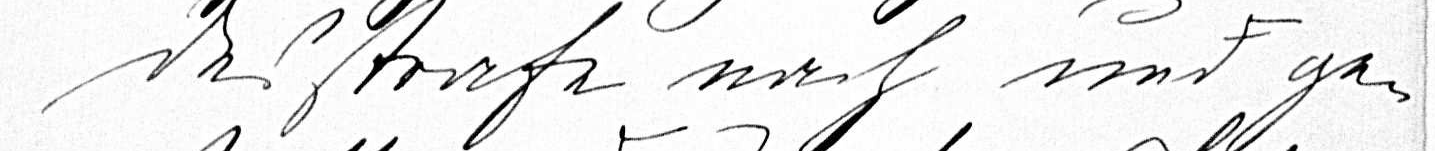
desstrafe nach und ge¬
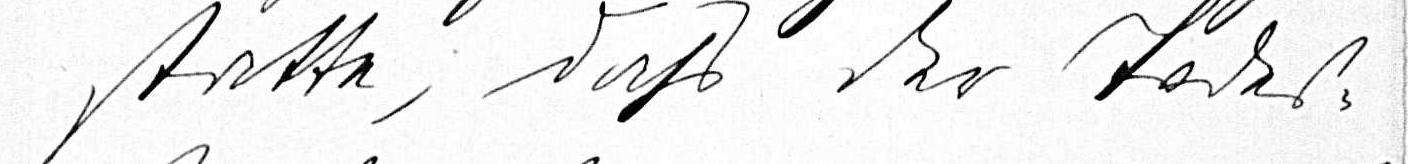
statte, daß der Todes¬
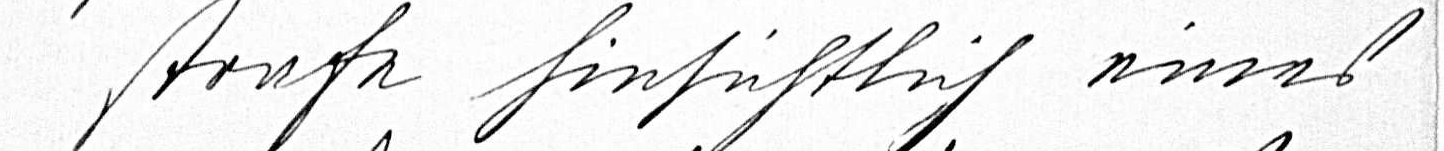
strafe hinsichtlich eines
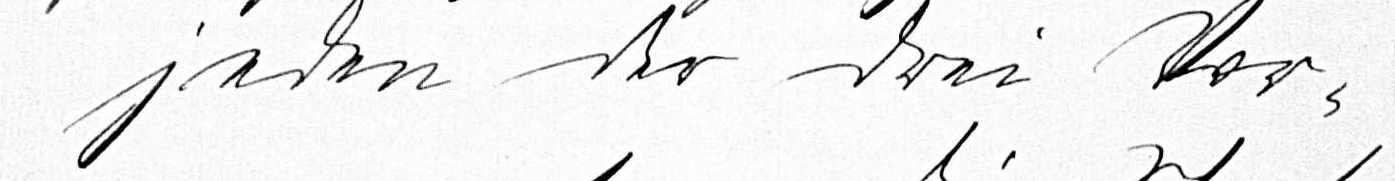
jeden der drei Vor¬
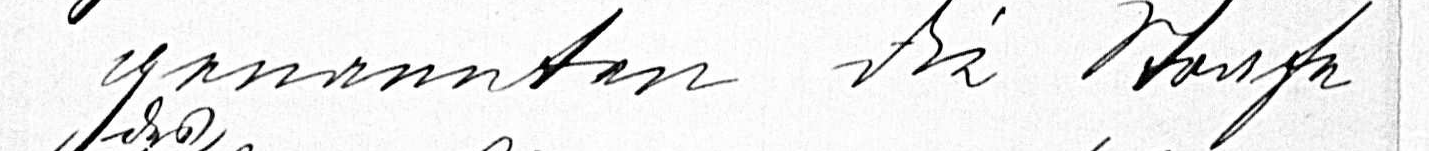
genannten die Strafe
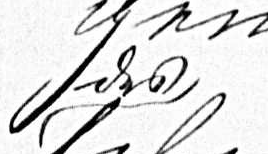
des
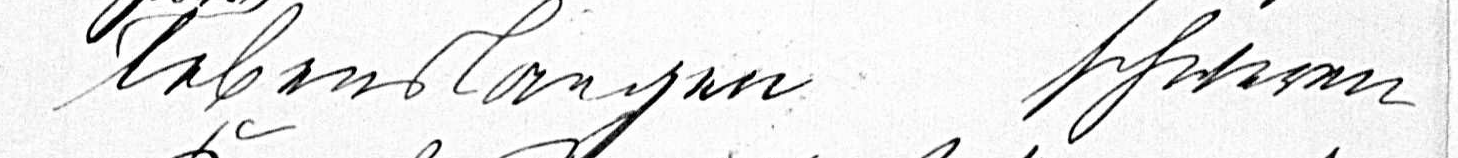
lebenslangen schweren
